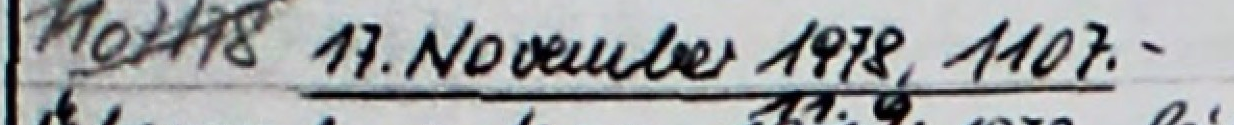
1107/78 17. November 1978, 1107.-
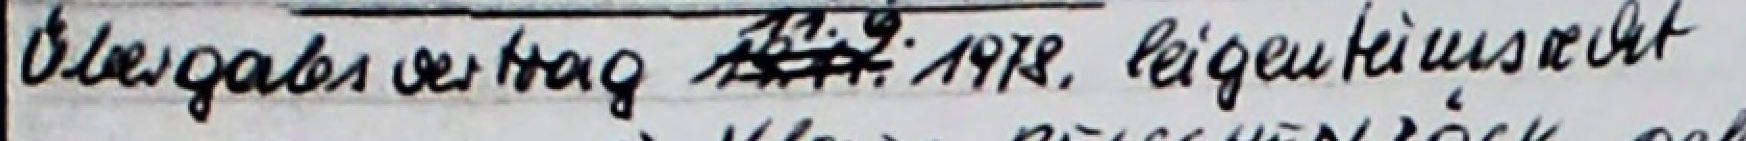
Übergabsvertrag 11.9.1978. leigentumsrecht
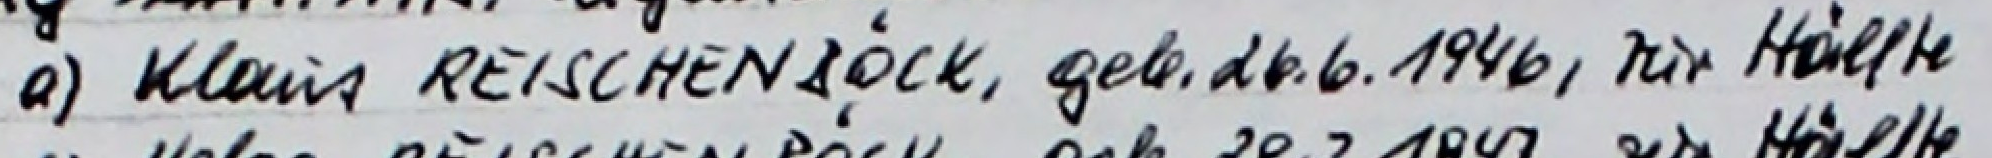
a) Klaus REISCHENBÖCK, geb. 26.6.1946, zur Hälfte
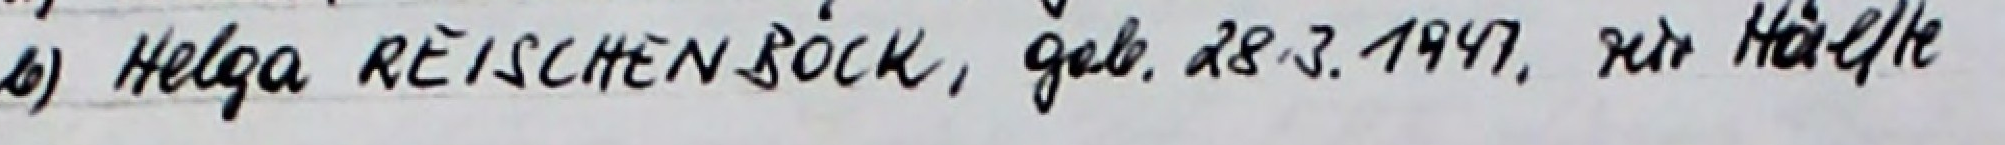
b) Helga REISCHENBÖCK, geb. 28.3.1947, zur Hälfte
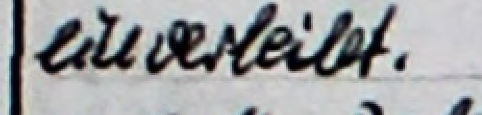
einverleibt.
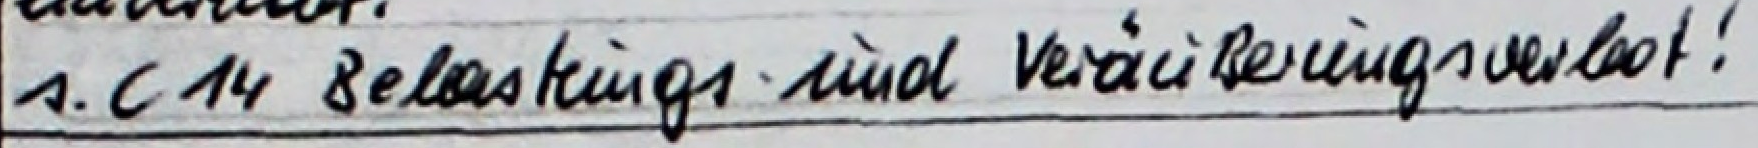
s.c 14 Belastungs- und Veräußerungsverbot!
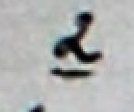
2
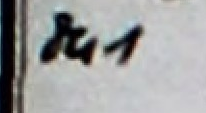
Zu 1
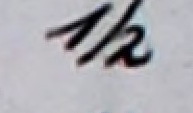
1/2
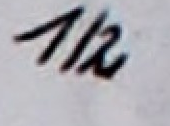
1/2
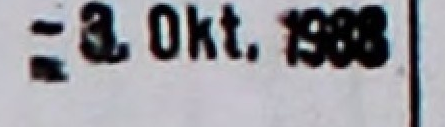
3. Okt. 1988
